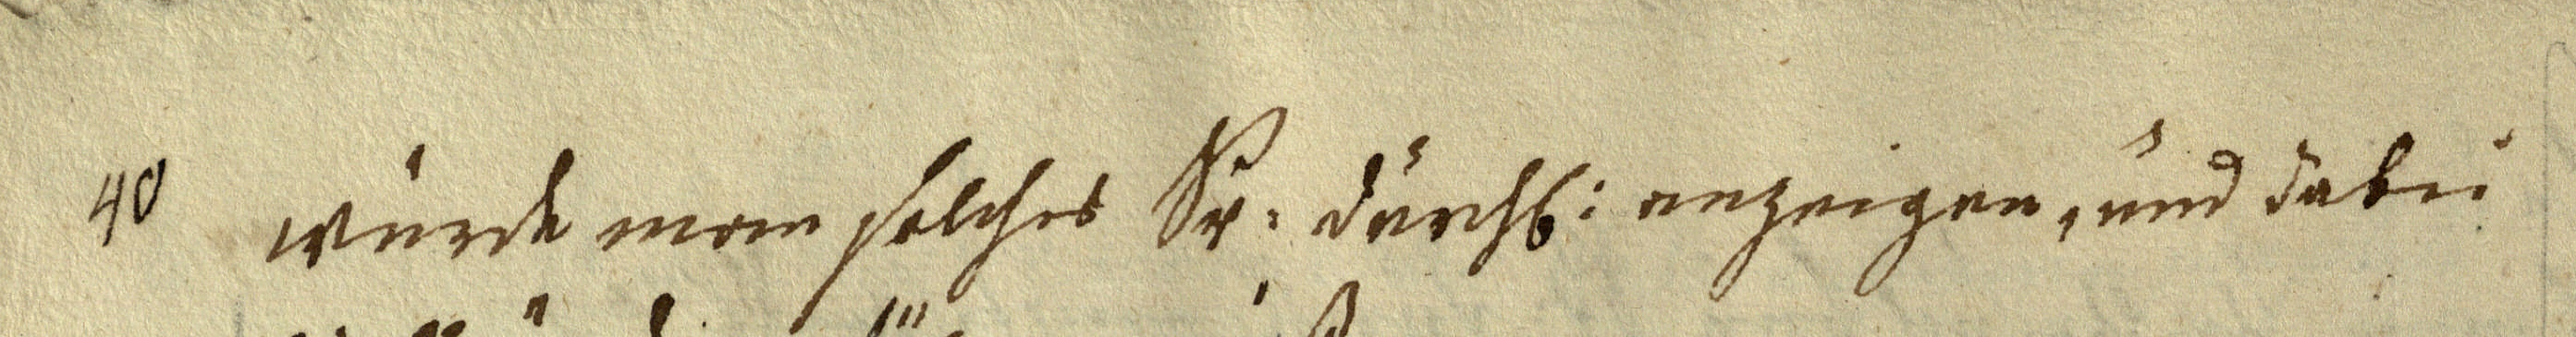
würde man solches Sr Durchl. anzeigen, und dabei
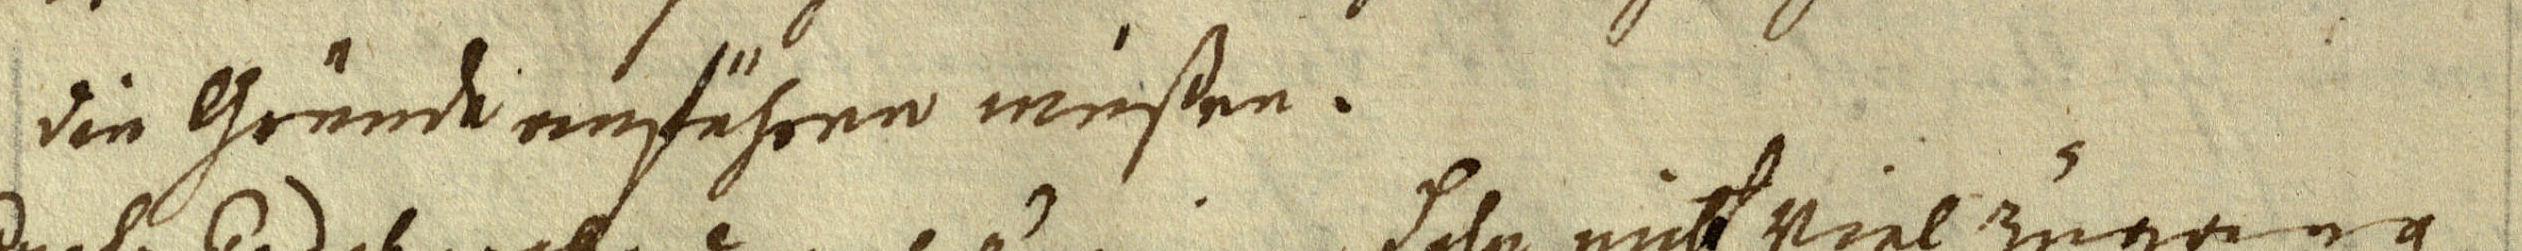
die Gründe anführen müßen.
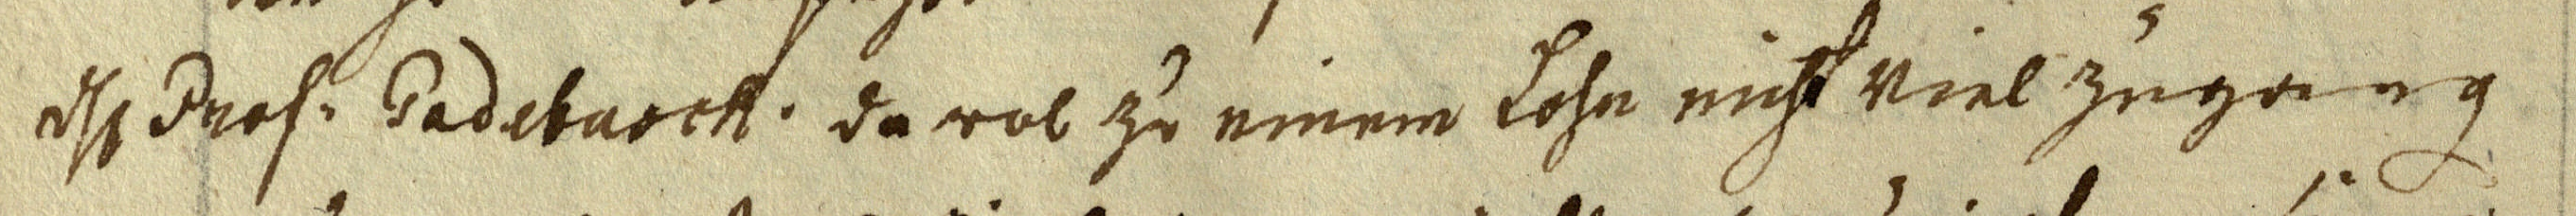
dh Prof. Gadebusch. Da wohl zu einem Lohn nicht viel Zugang
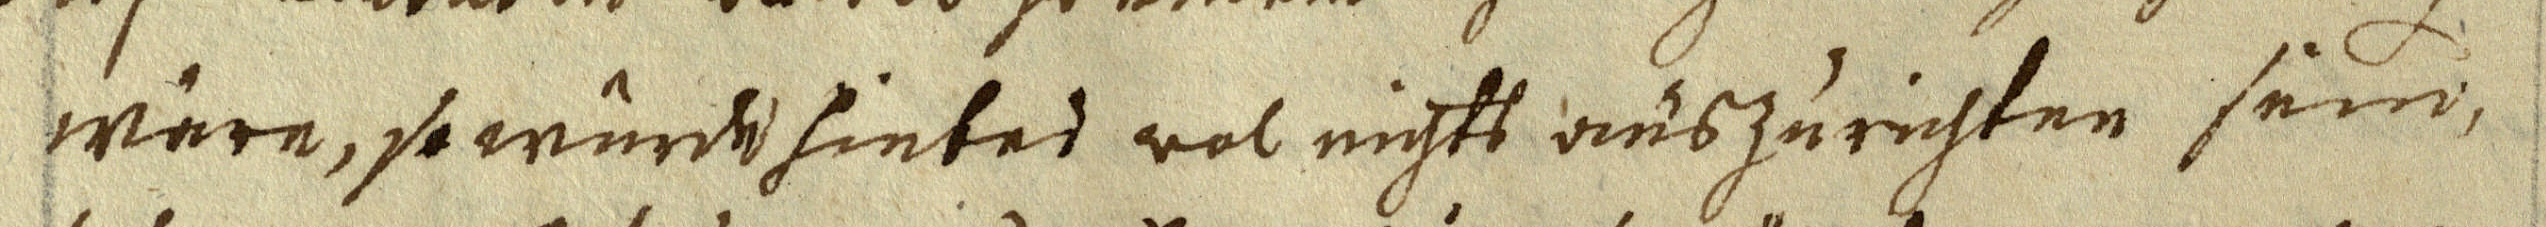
wäre, so würde hiebei wol nichts auszurichten sein,
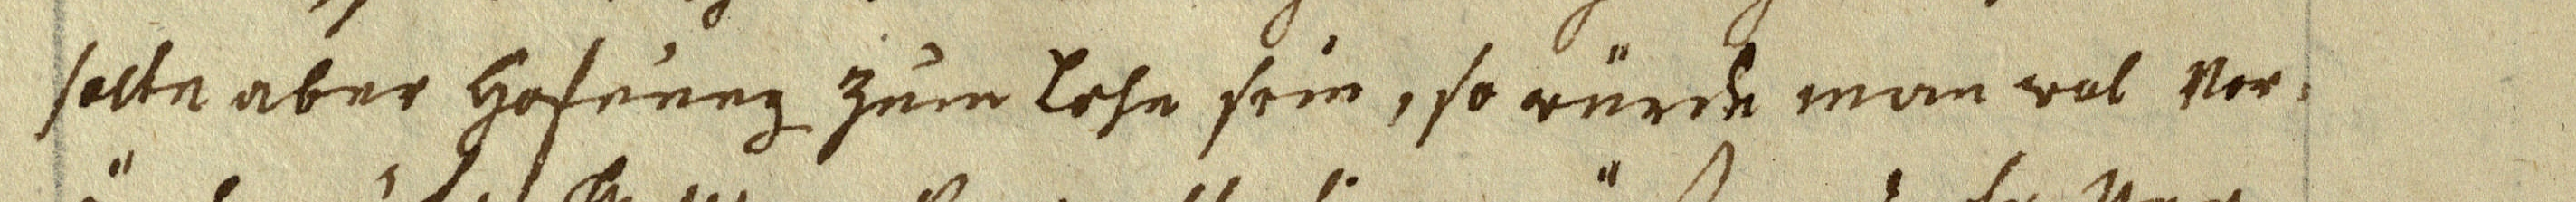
solte aber Hofnung zum Lohn sein, so würde man wol vor¬
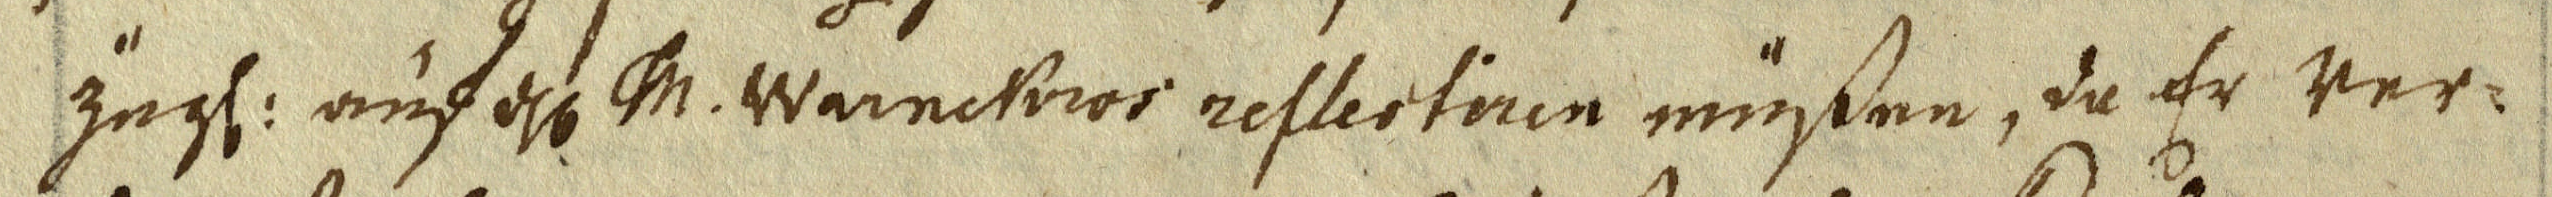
zügl. auf dh M. Warnekros reflectiren müßen, da Er Ver¬
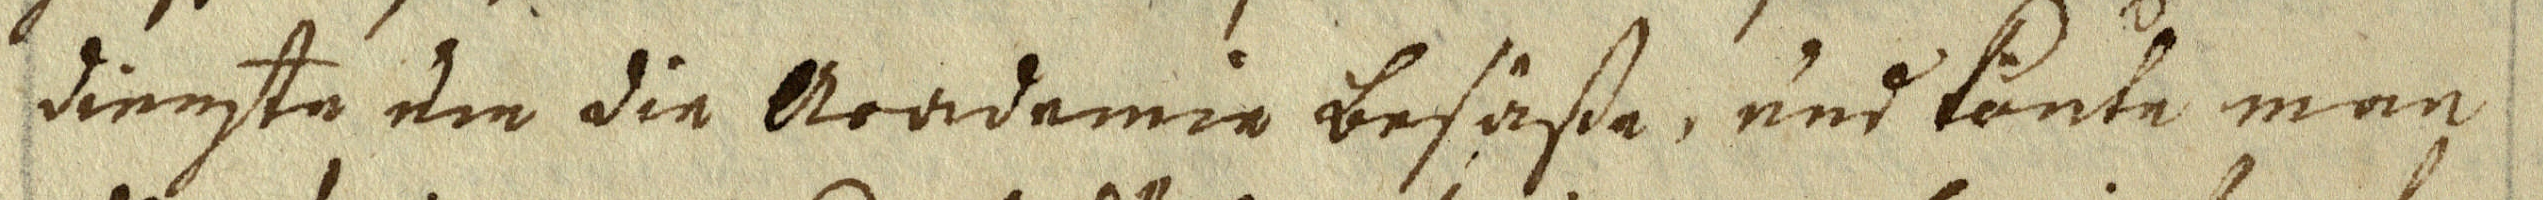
dienste um die Academie besäße, und könte man
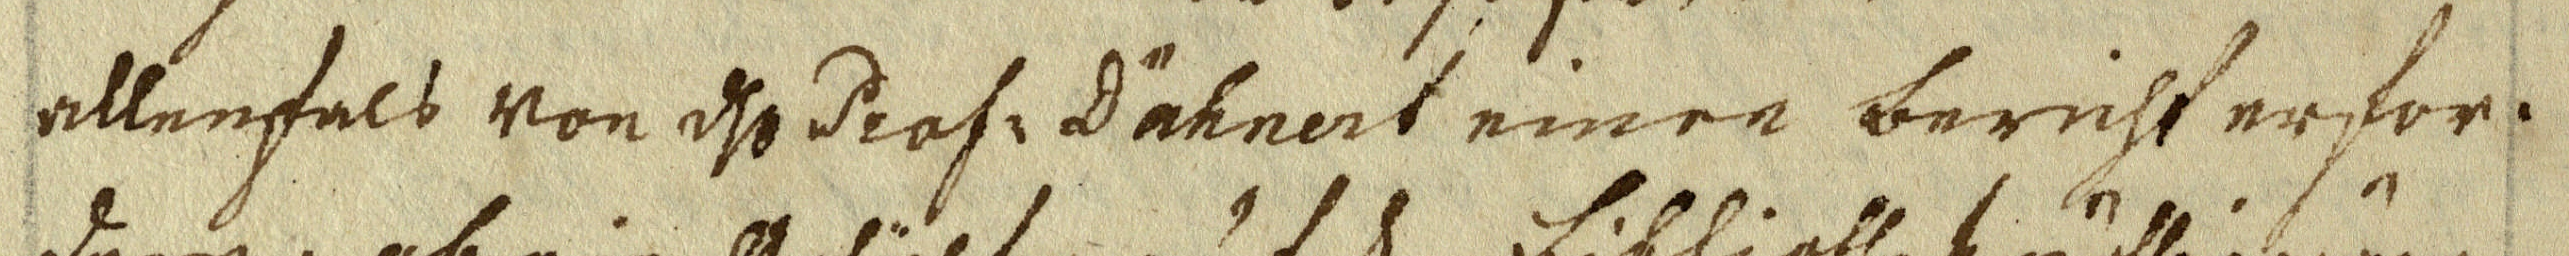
allenfals von dh Prof. Dähnert einen Bericht erfor¬
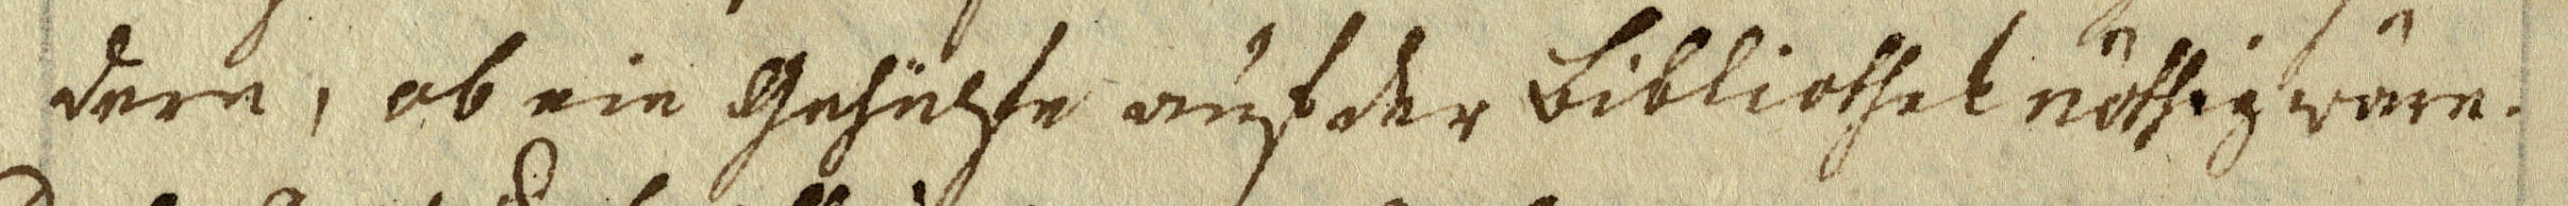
dern, ob ein Gehülfe auf der Bibliothek nöthig wäre.
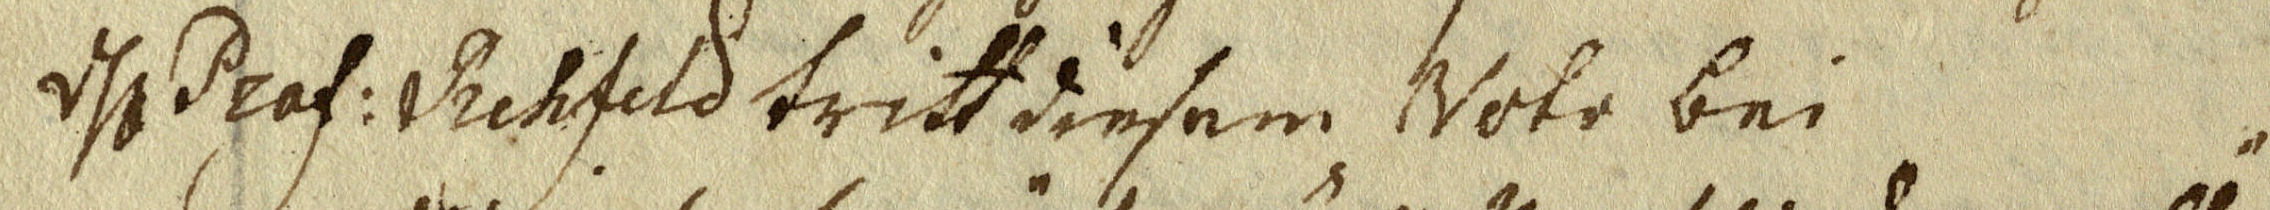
dh Prof. Rehfeld tritt diesem Voto bei.
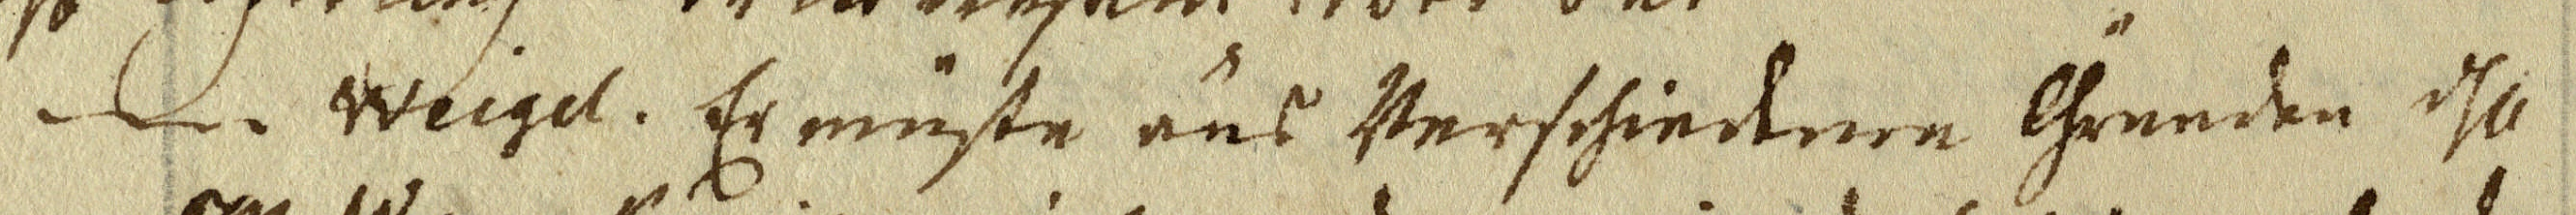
Weigel. Er müste aus verschiedenen Gründen dh
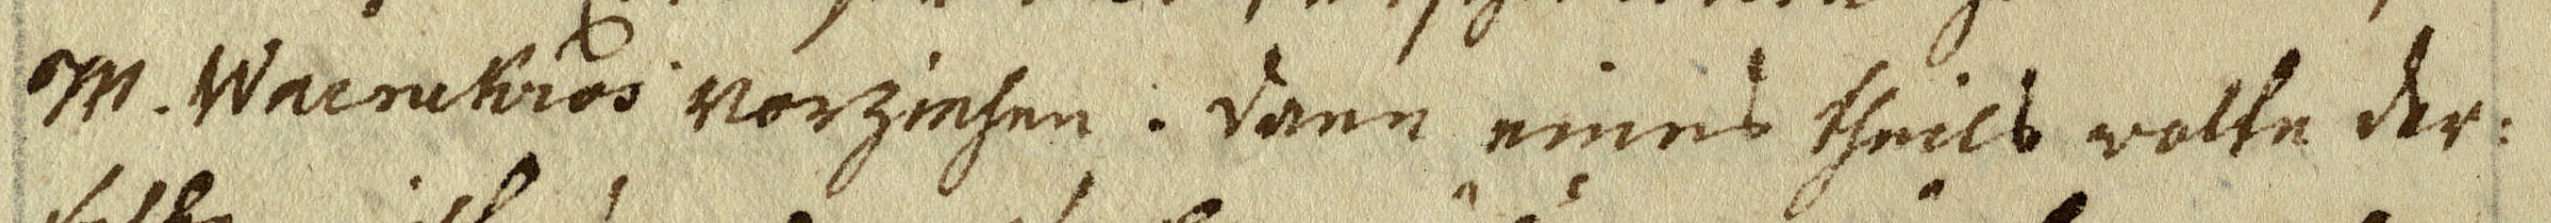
M. Warnekros vorziehen. Dann eines theils wolte der¬
